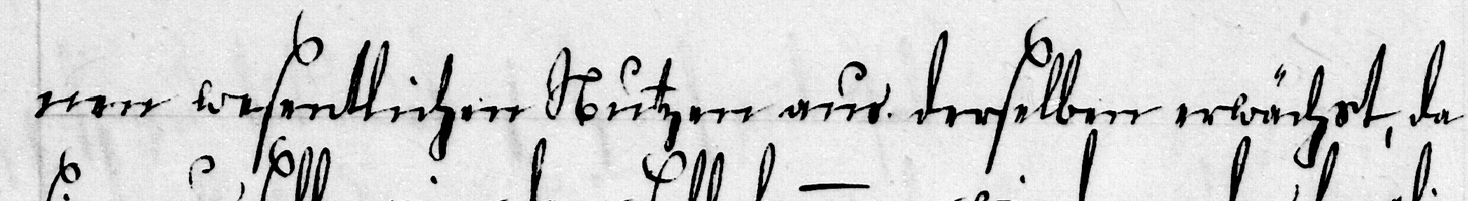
nen wesentlichen Nutzen aus derselben erwächst, da
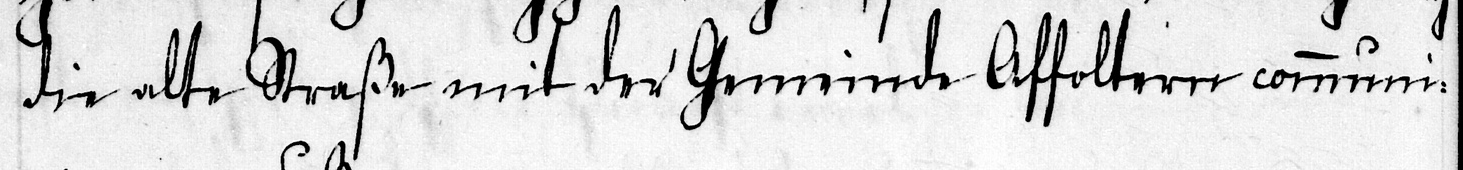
die alte Straße mit der Gemeinde Affoltern communi¬
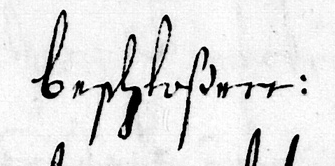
beschloßen:
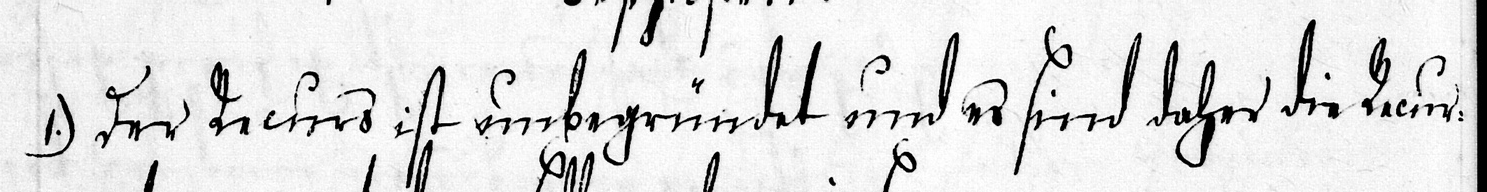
1.) Der Recurs ist unbegründet und es sind daher die Recu¬
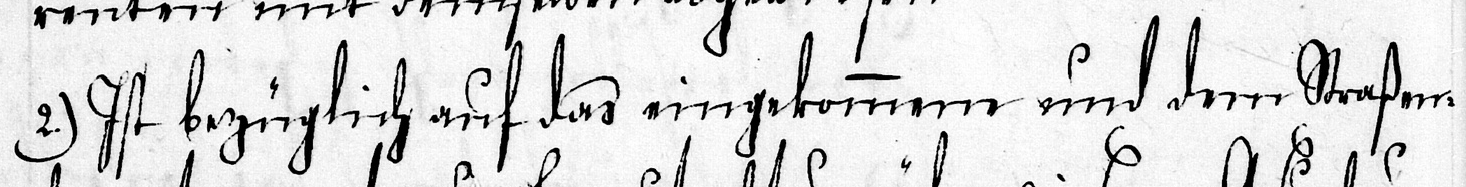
2.) Ist bezüglich auf das eingekommene und dem Straßen¬
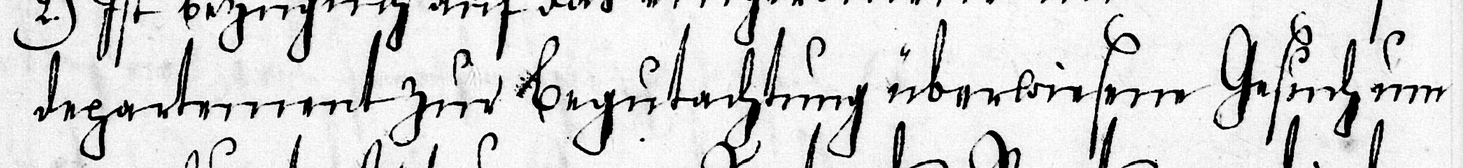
departement zur Begutachtung überwiesene Gesuch um
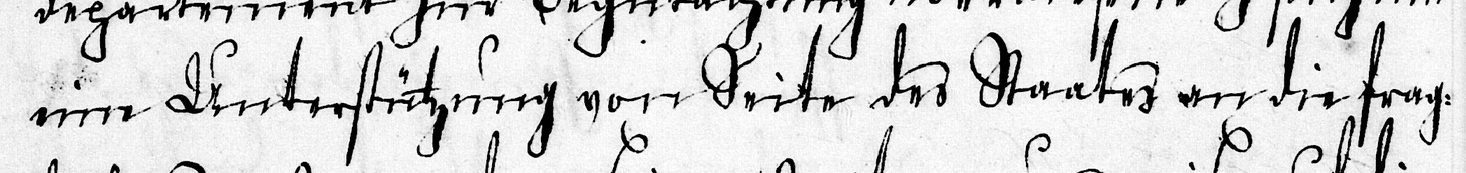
eine Unterstützung von Seite des Staates an die frag¬
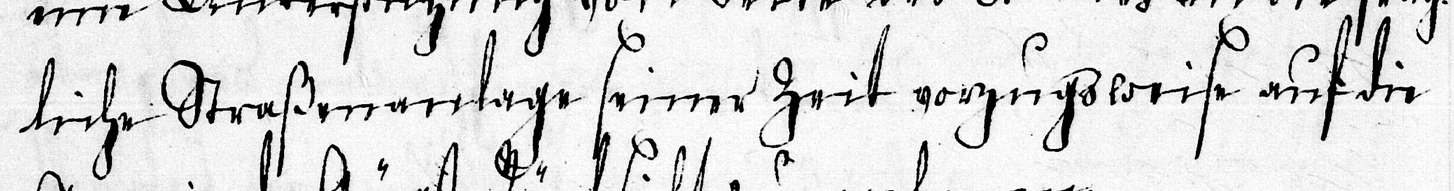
liche Straßenanlage seiner Zeit vorzugsweise auf die
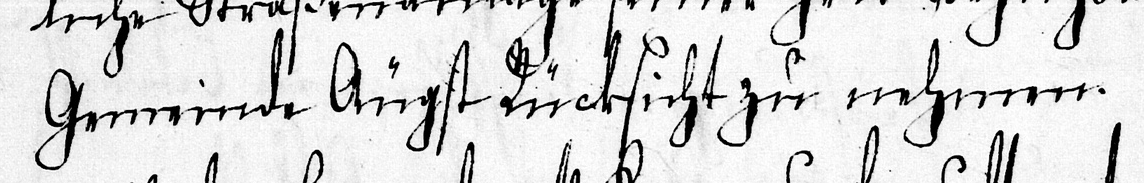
Gemeinde Äugst Rücksicht zu nehmen.
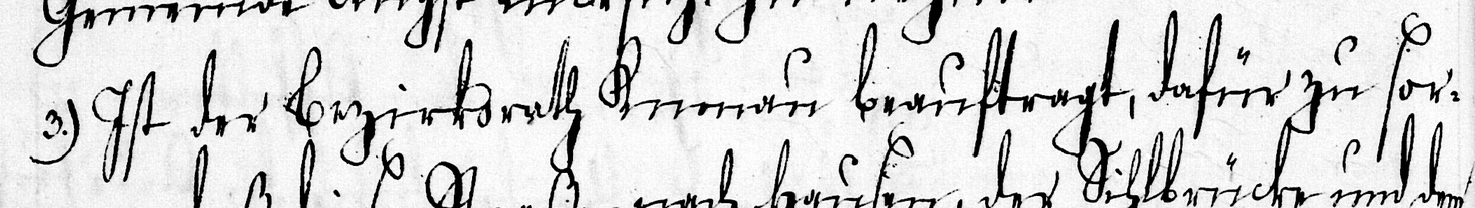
3.) Ist der Bezirksrath Knonau beauftragt, dafür zu sor¬
